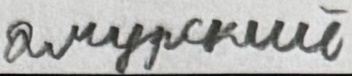амурский
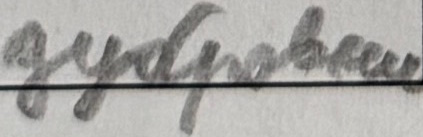дубровни
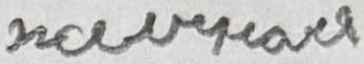желчная
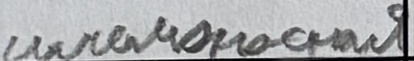шлемоносная
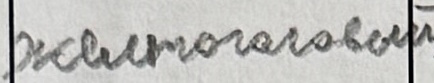желтоголовый
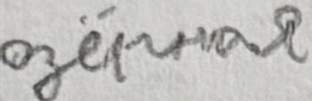озёрная
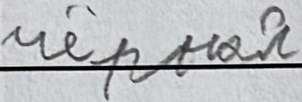чёрная
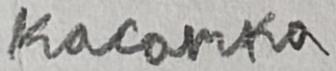касотка
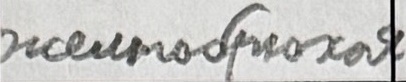желтобрюхая
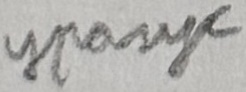урагус
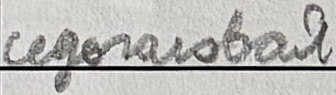седоголовая
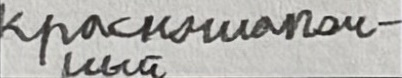красношапоч-ный
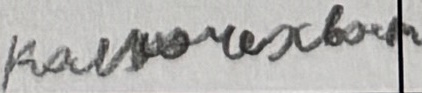колючехвост
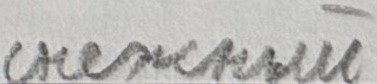снежный
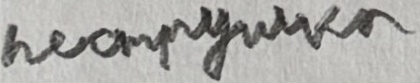пеструшка
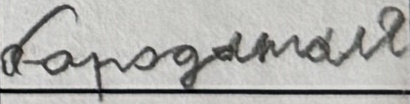бородатая
